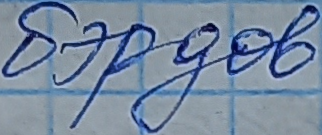бэрдов
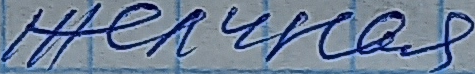желчная
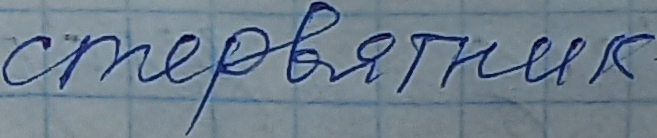стервятник
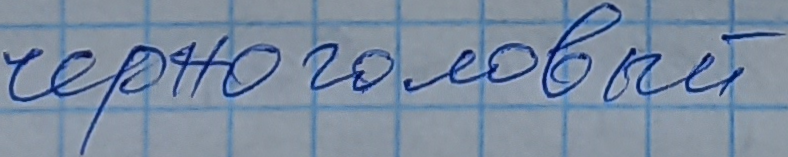черноголовый
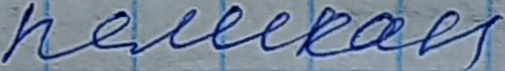пеликан
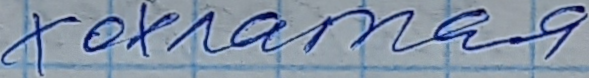хохлатая
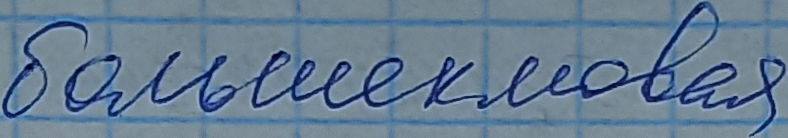большеклювая
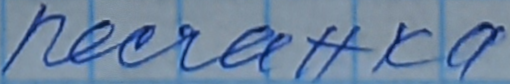песчанка
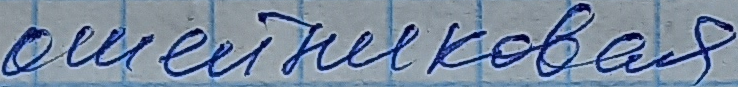ошейниковая
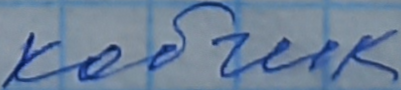кобчик
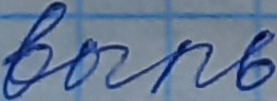выпь
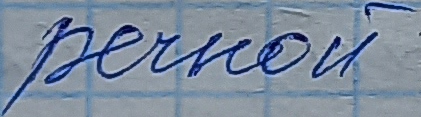речной
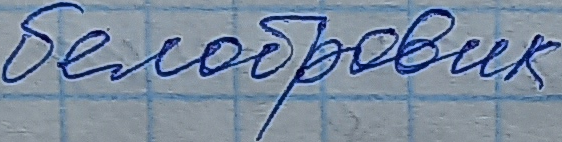белобровик
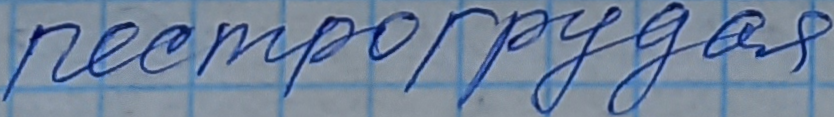пестрогрудая
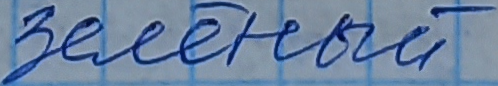зелёный
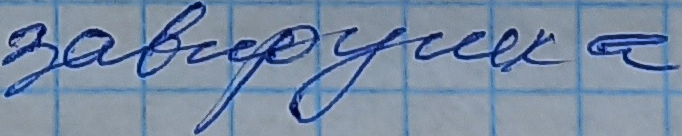завирушка
